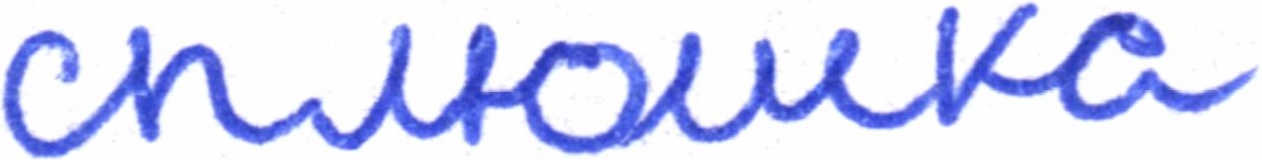сплюшка
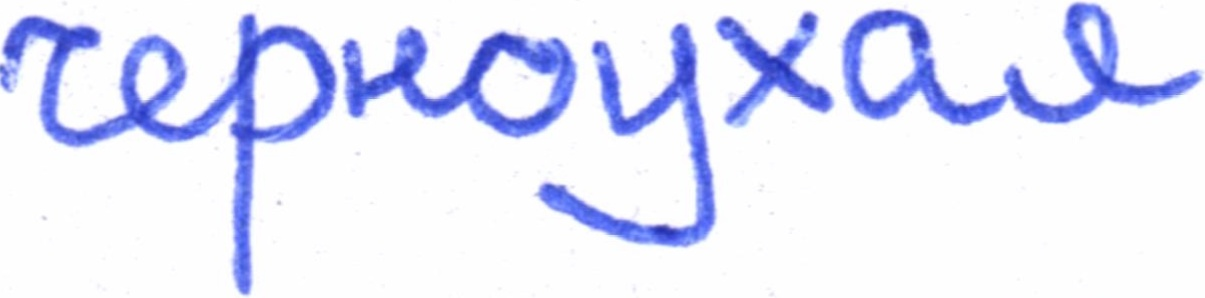черноухая
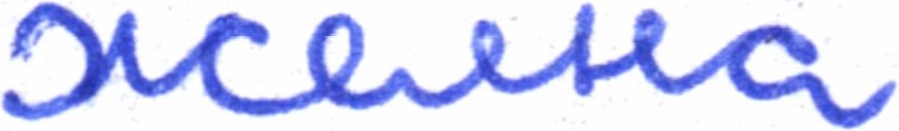желна
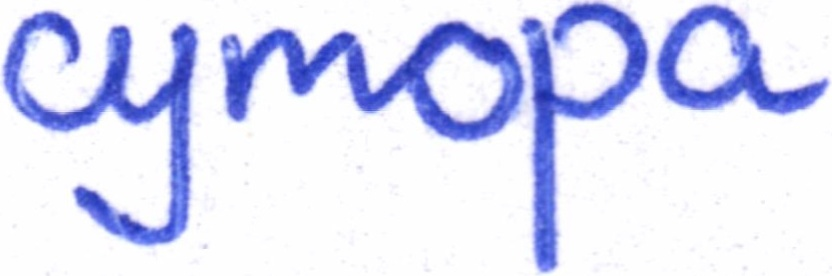сутора
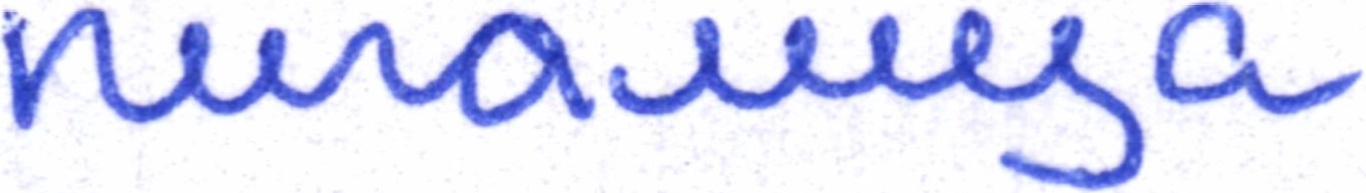пигалица
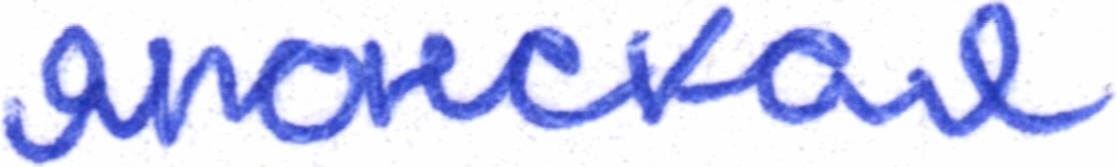японская
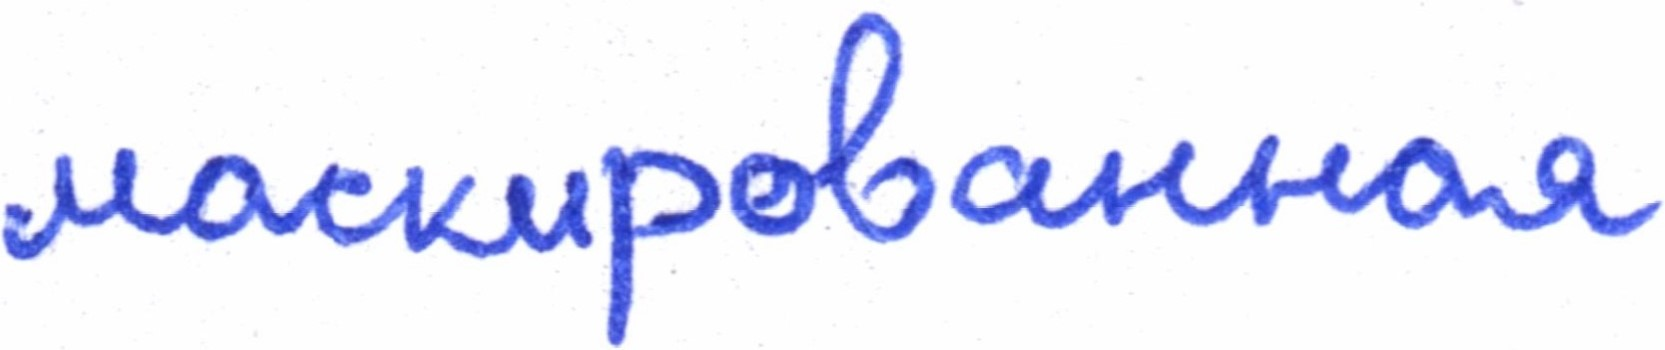маскированная
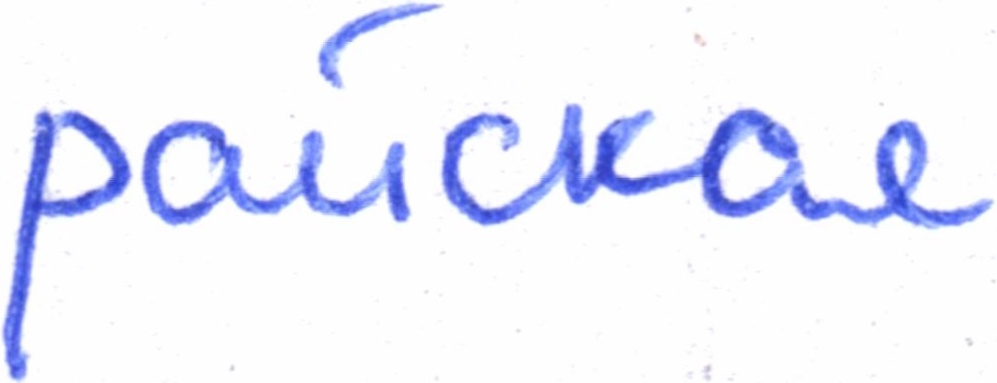райская
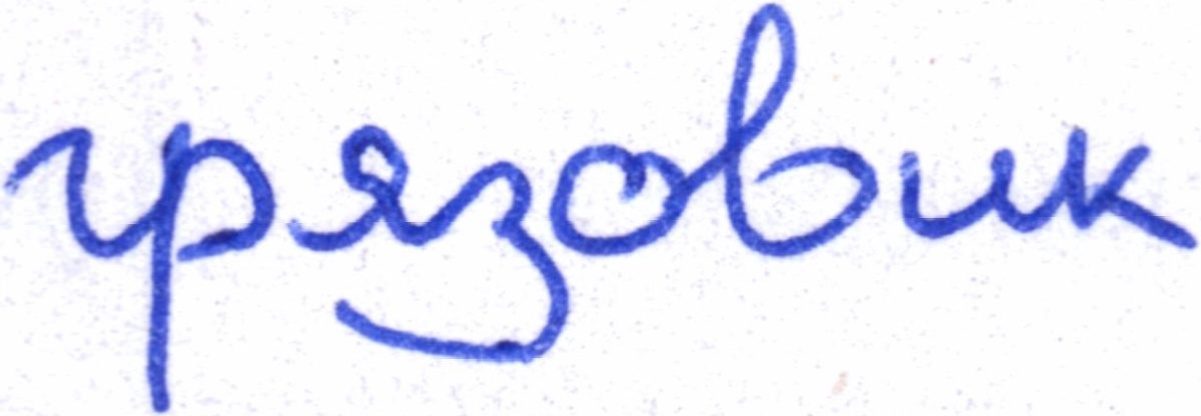грязовик
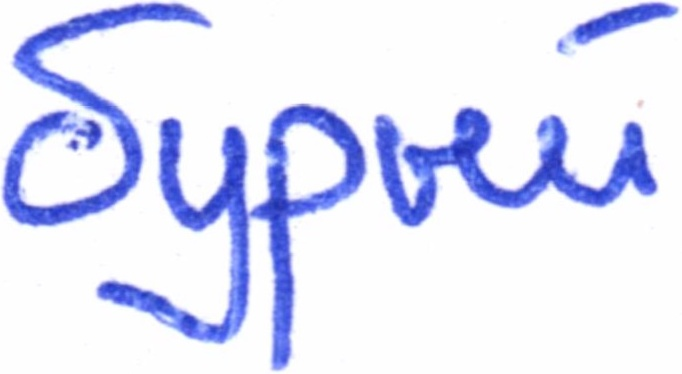бурый
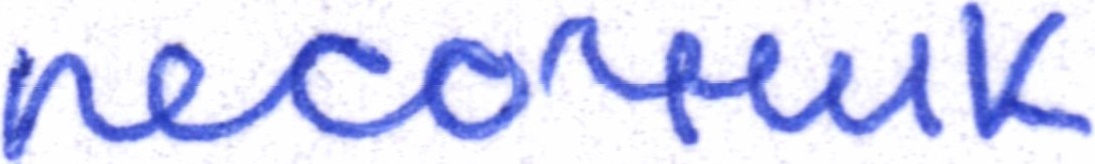песочник
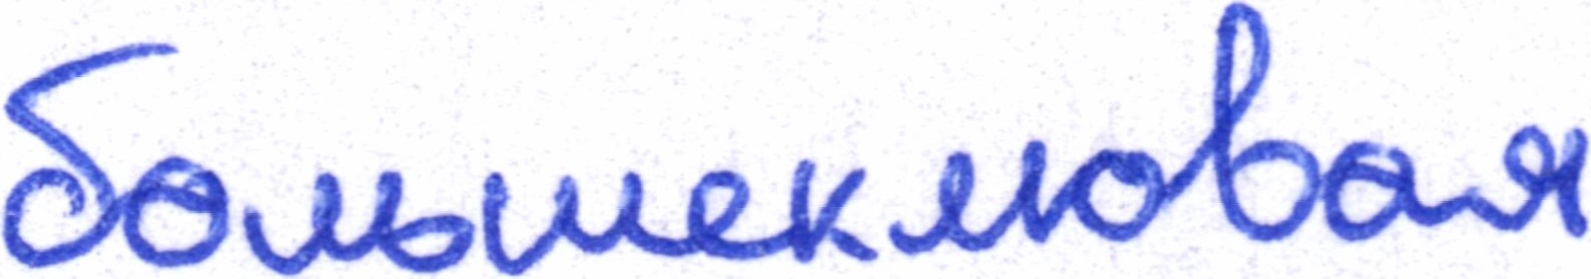большеклювая
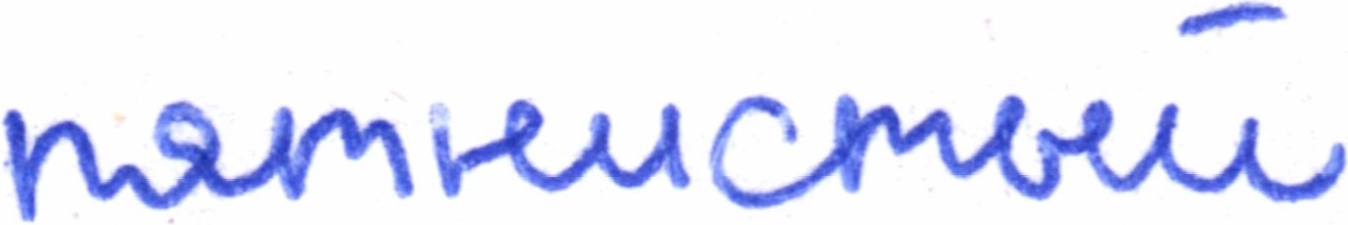пятнистый
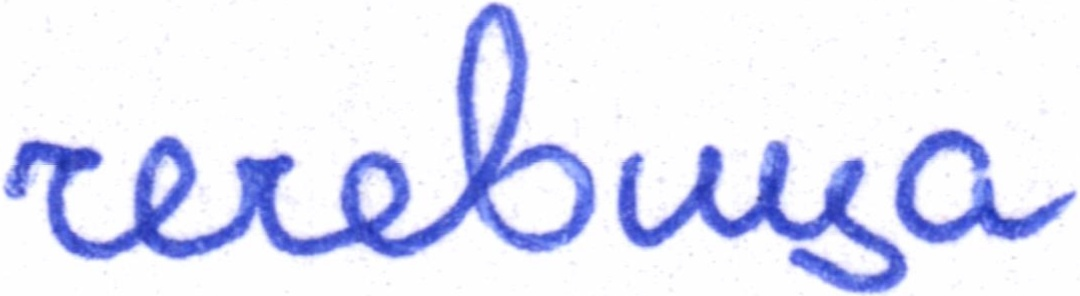чечевица
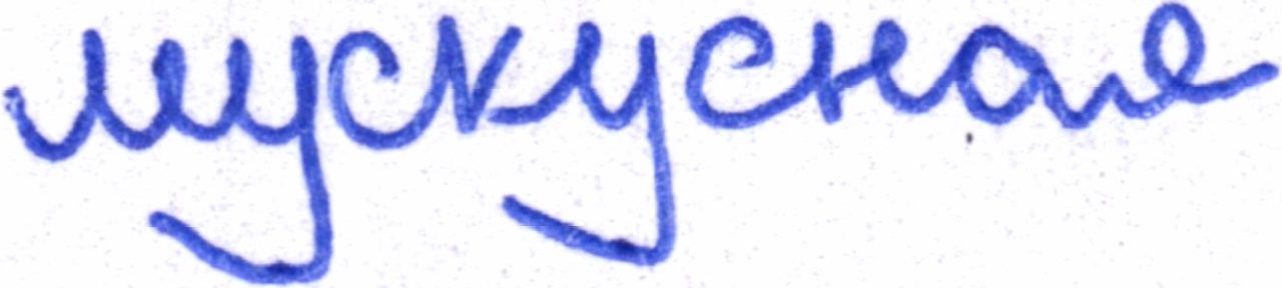мускусная
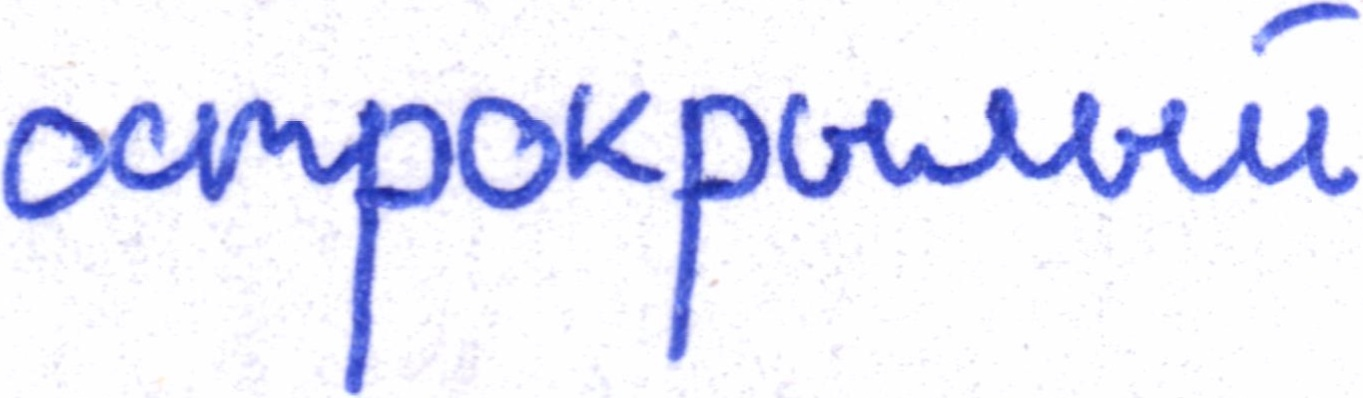острокрылый
